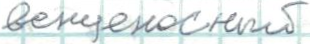венценосный
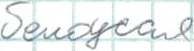белоусая
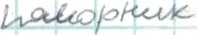поморник
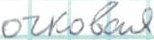очковая
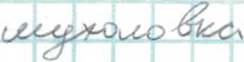мухоловка
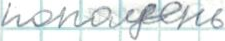поползень
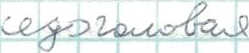седоголовая
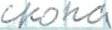скопа
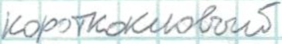короткоклювый
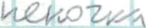пеночка
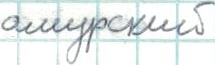амурский
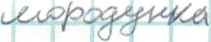мородунка
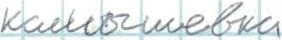камышевка
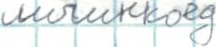личинкоед
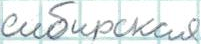сибирская
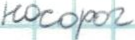носорог
